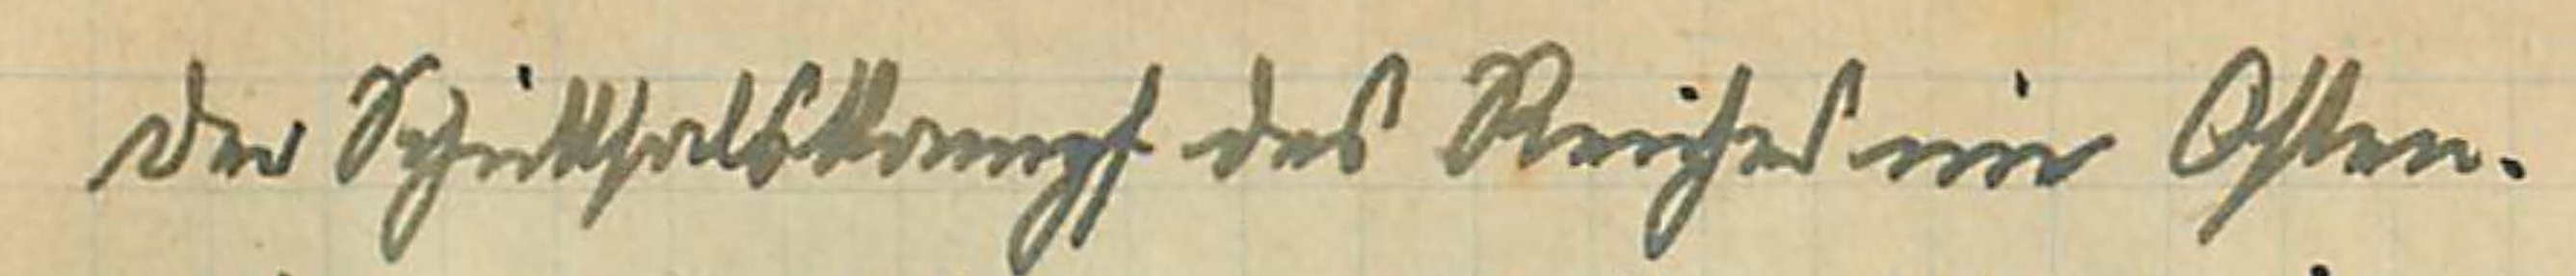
Der Schicksalskampf des Reiches im Osten.
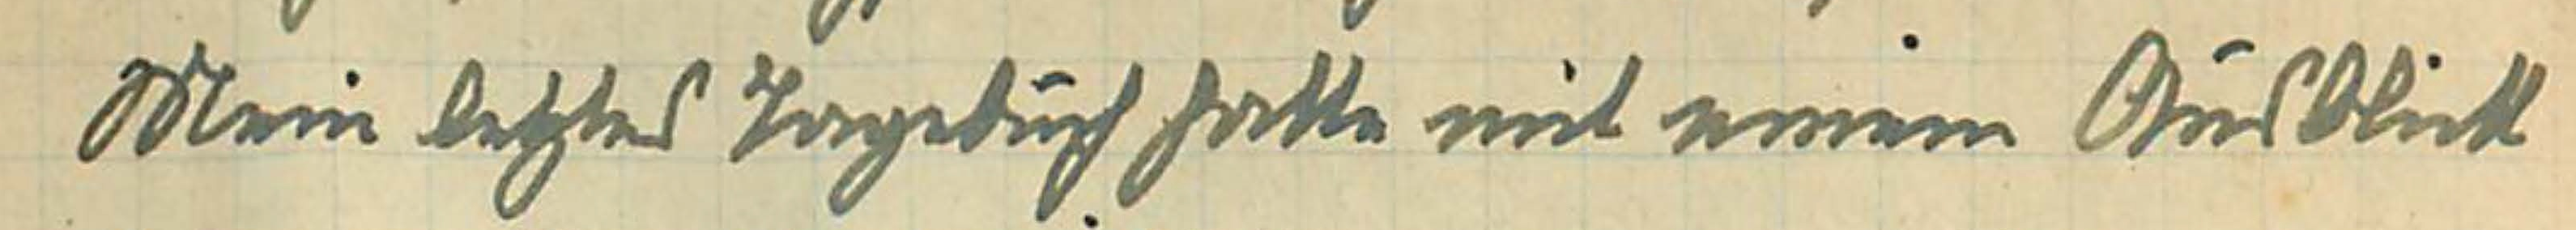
Mein letztes Tagebuch hatte mit einem Ausblick
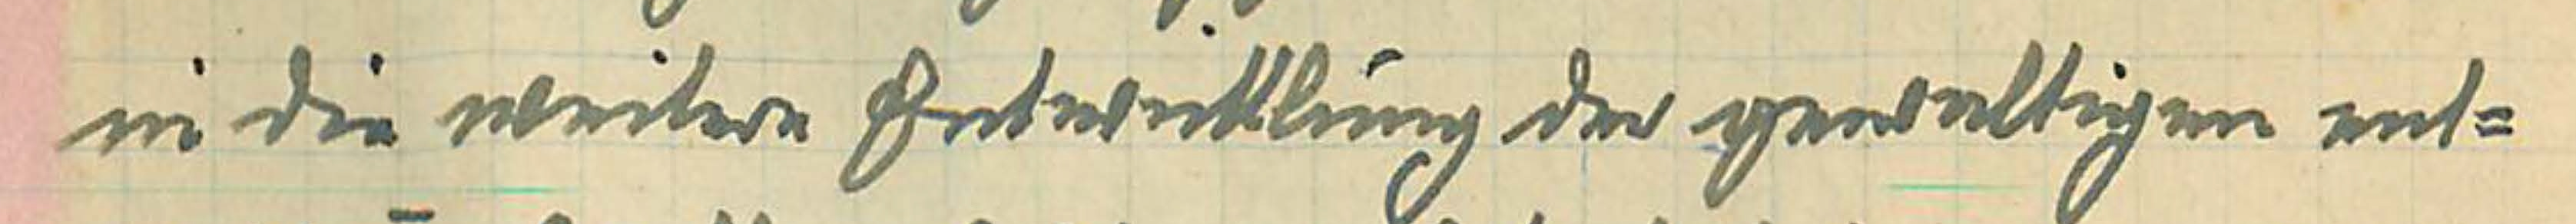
in die weitere Entwicklung der gewaltigen ent-
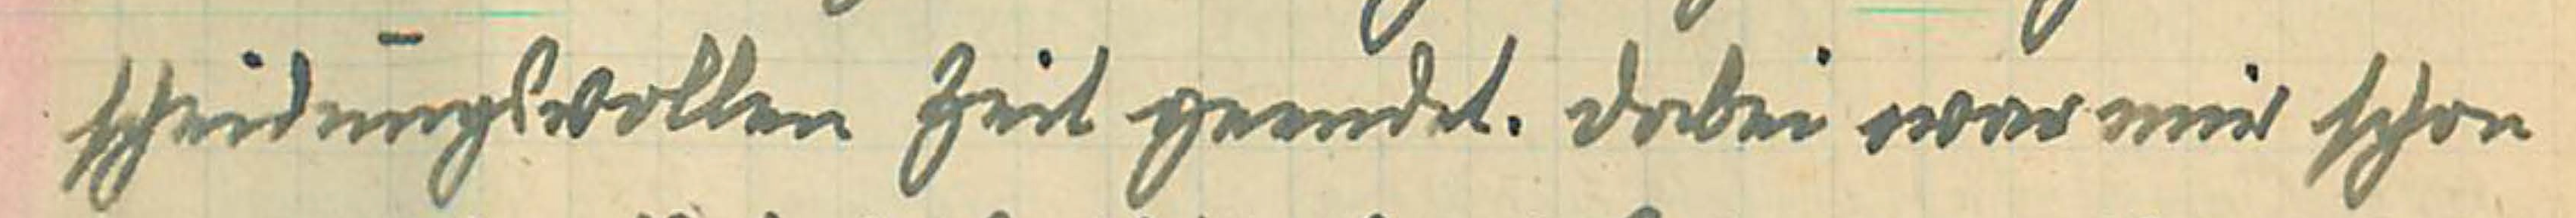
scheidungsvollen Zeit geendet. Dabei war mir schon
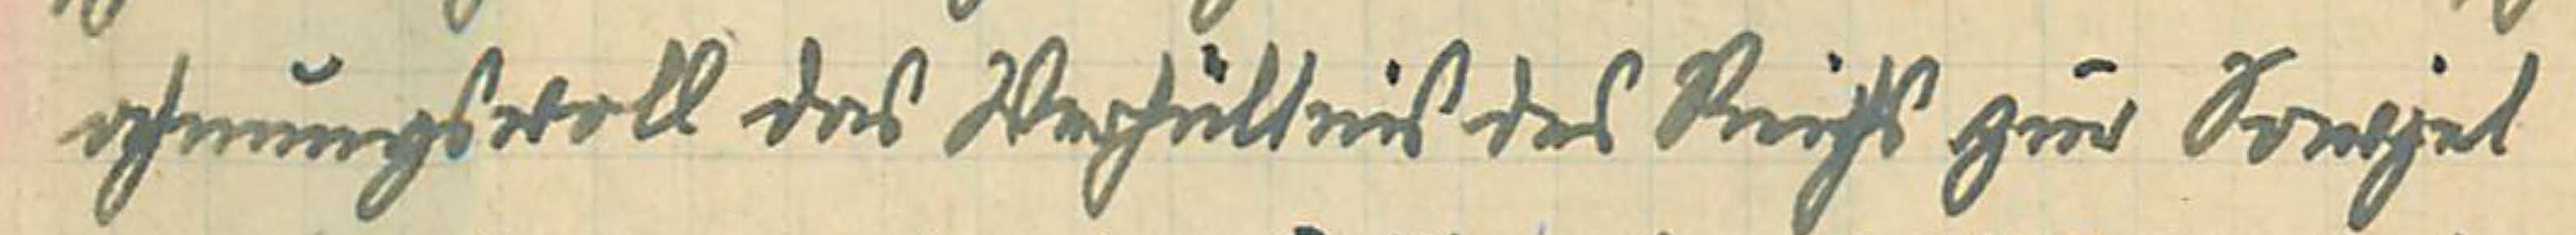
ahnungsvoll das Verhältnis des Reichs zur Sowjet
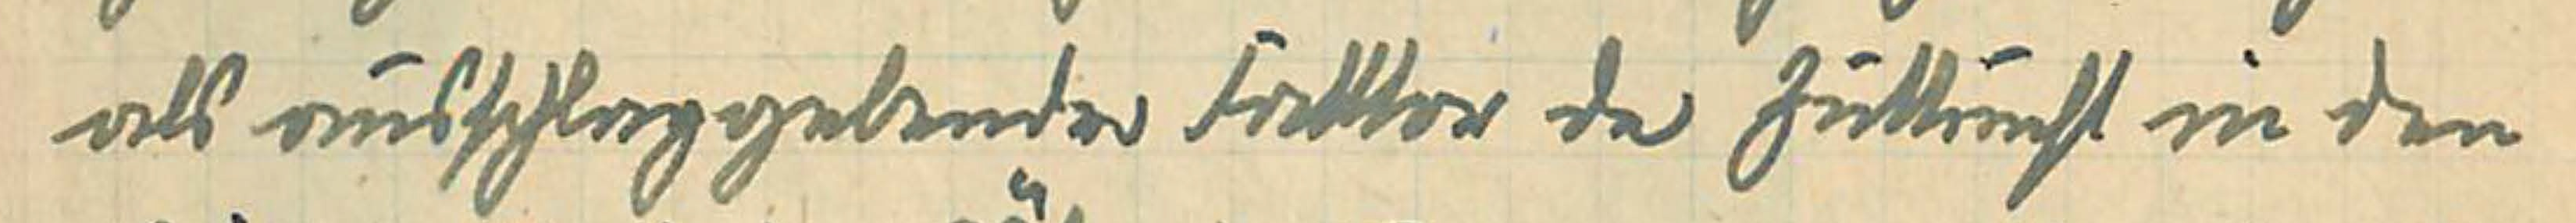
als ausschlaggebender Faktor der Zukunft in den
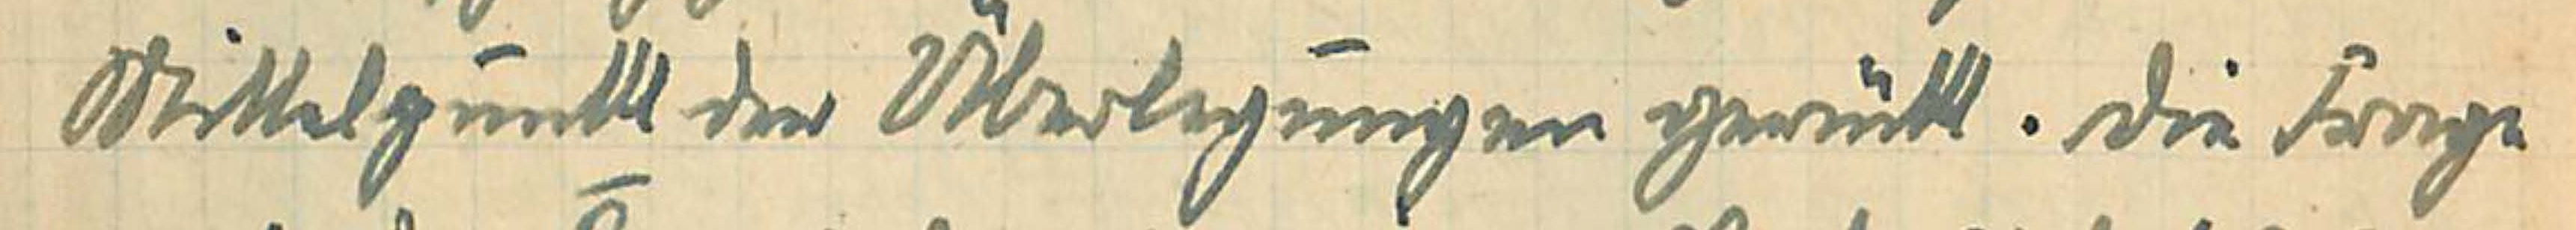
Mittelpunkt der Überlegungen gerückt. Die Frage
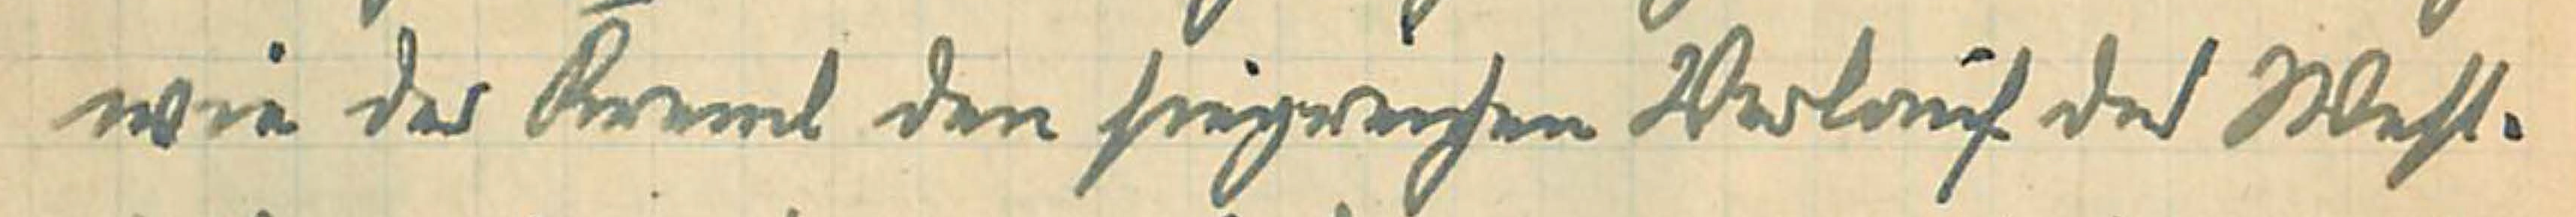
wie der Kreml den siegreichen Verlauf des West-
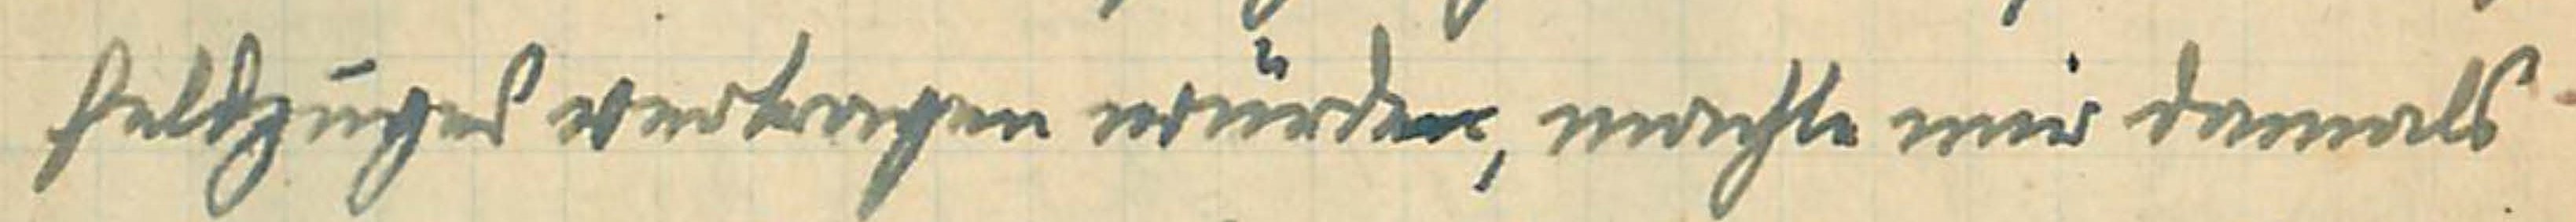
feldzuges vertragen würden, machte mir damals
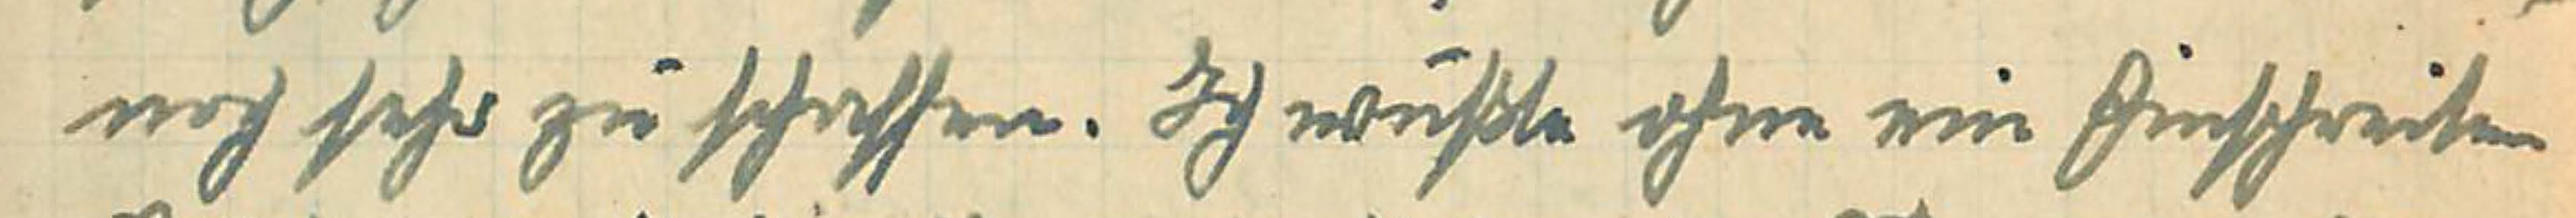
noch sehr zu schaffen. Ich wußte ohne ein Einschreiten
